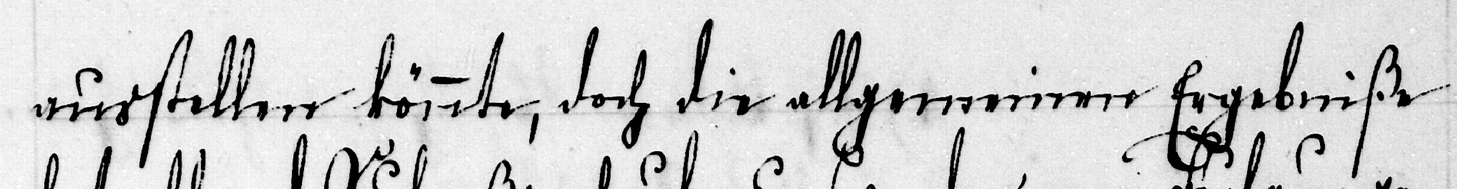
ausstellen könnte, doch die allgemeinen Ergebniße
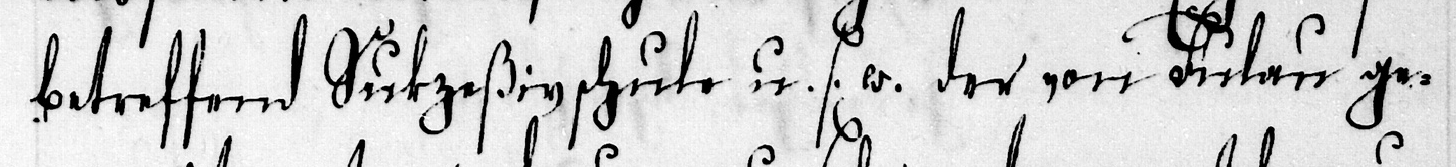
betreffend Sukzeßivschule u. s. w. der von Fulau ge¬
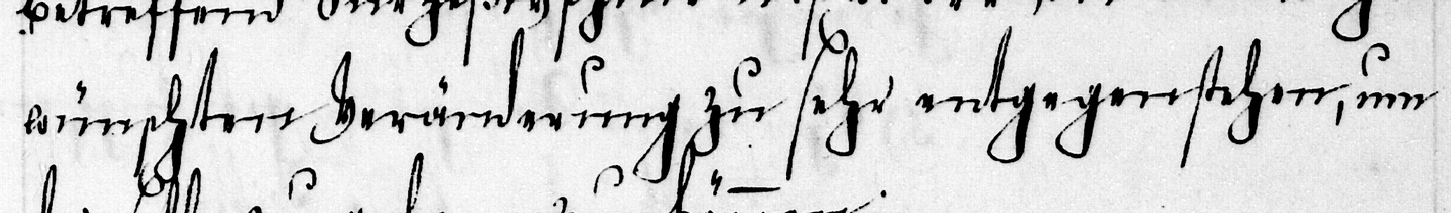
wünschten Veränderung zu sehr entgegenstehen, um
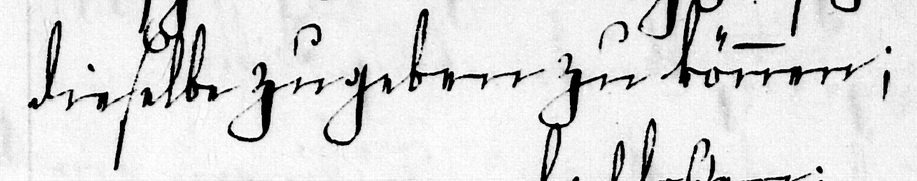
dieselbe zugeben zu können;
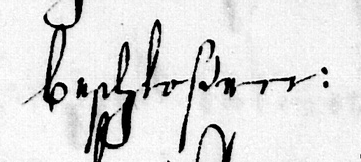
beschloßen:
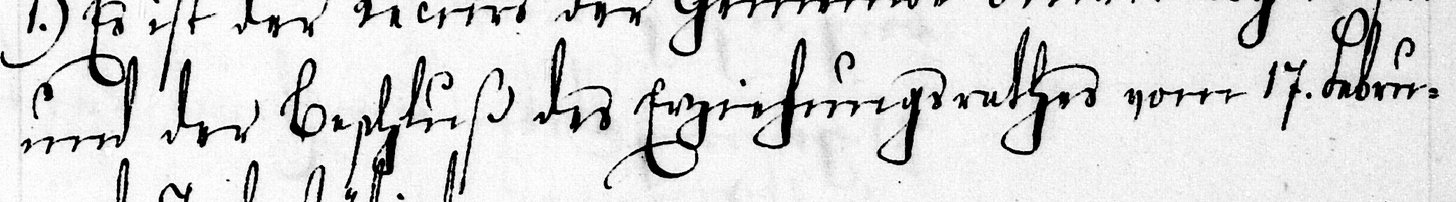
und der Beschluß des Erziehungsrathes vom 17. Febru¬
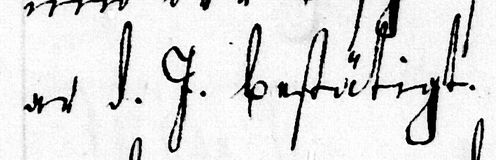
ar d. J. bestätigt.
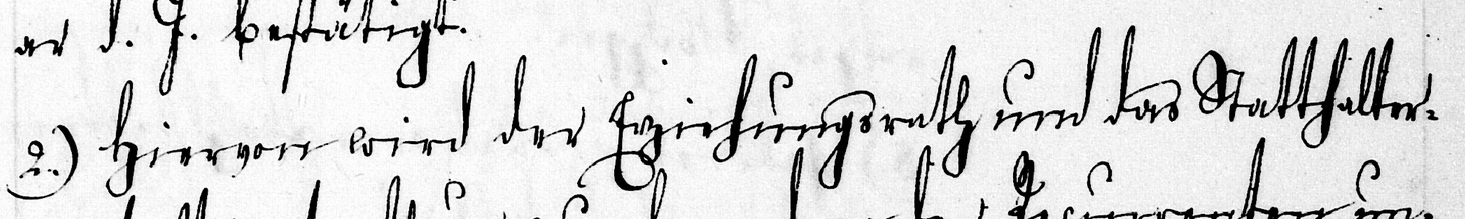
2.) Hiervon wird der Erziehungsrath und das Statthalter¬
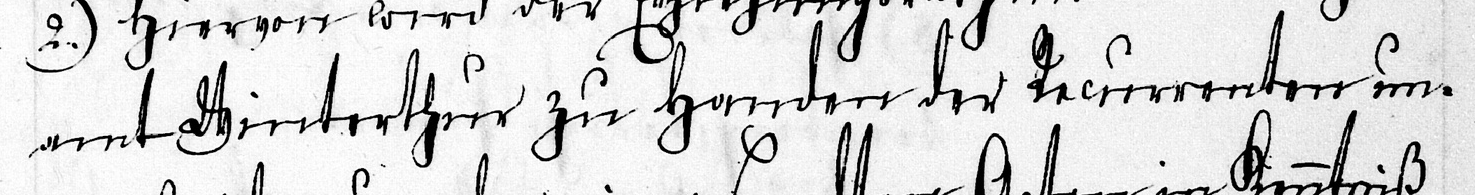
amt Winterthur zu Handen der Recurrenten un¬
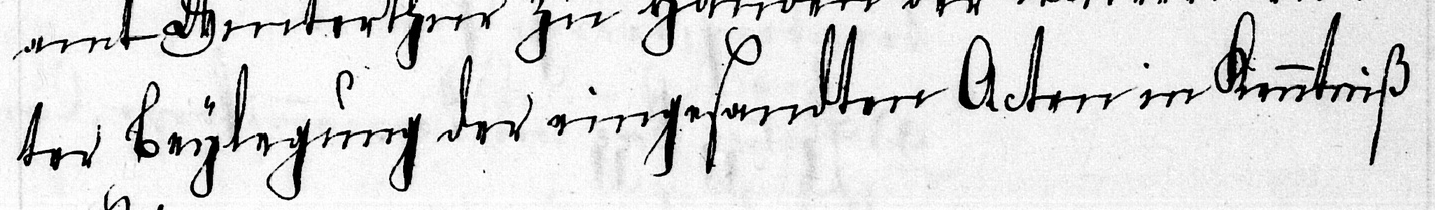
ter Beylegung der eingesandten Acten in Kenntniß
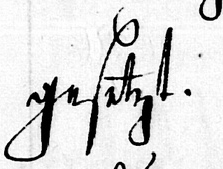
gesetzt.
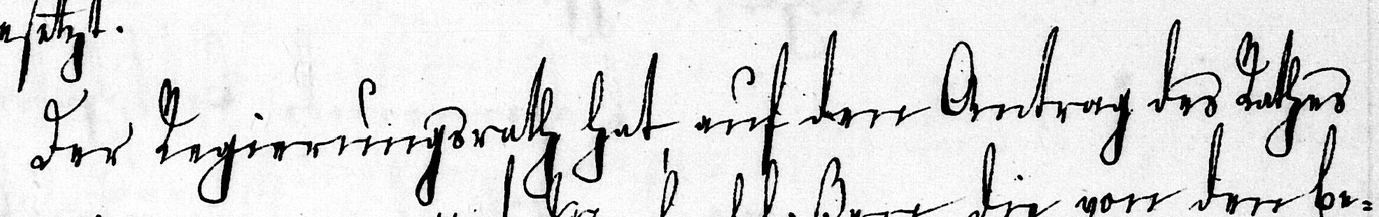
Der Regierungsrath hat auf den Antrag des Rathes
